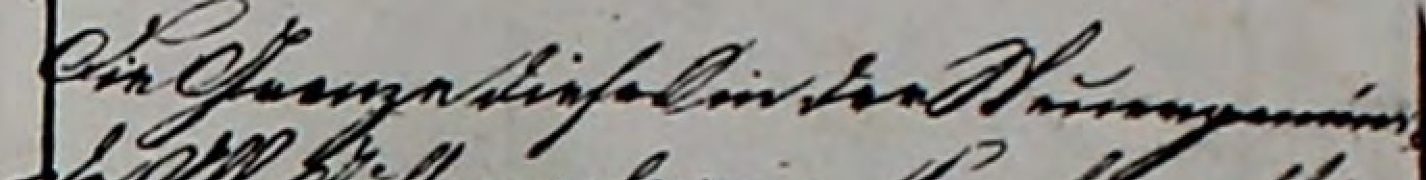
Die Grenze dieses in der Steuergemein„
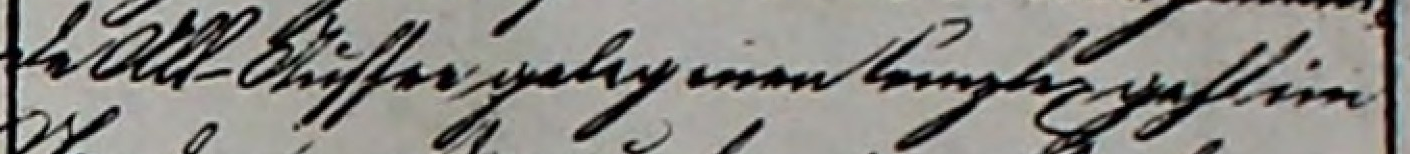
de Alt-Aussee gelegenen Complex geht im
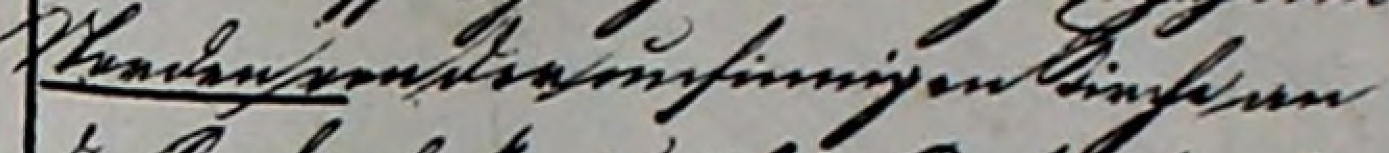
Nerden von die unsinnigen Kirche an
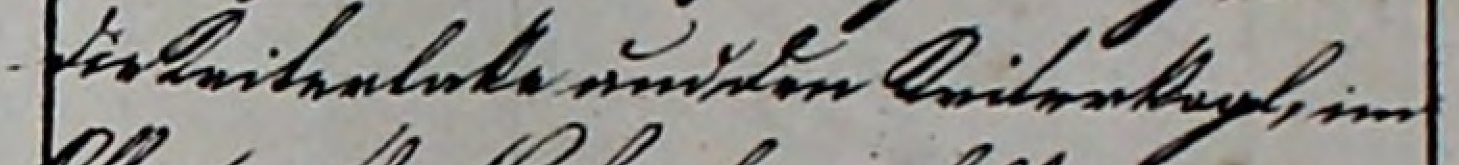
die Kriterlake und den Kriterkogl, im
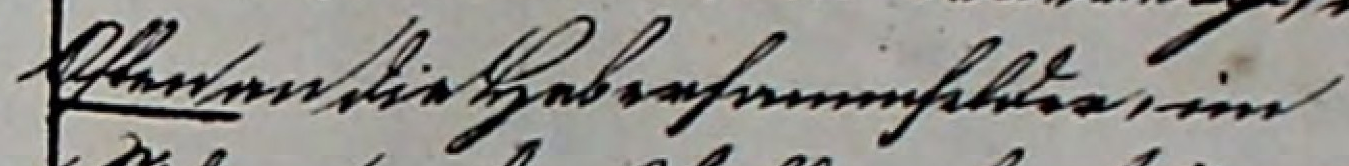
Osten an die Hebersammfelder, im
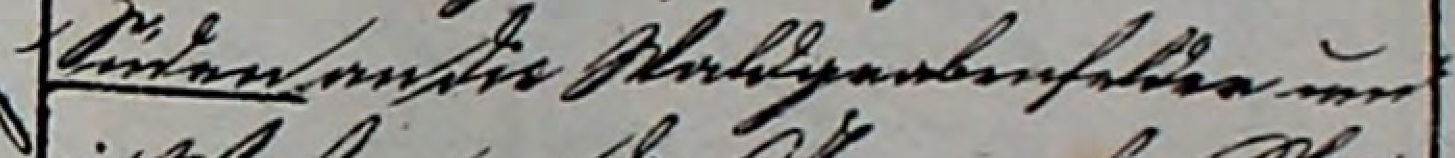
Süden an die Waldgrabenfelder und
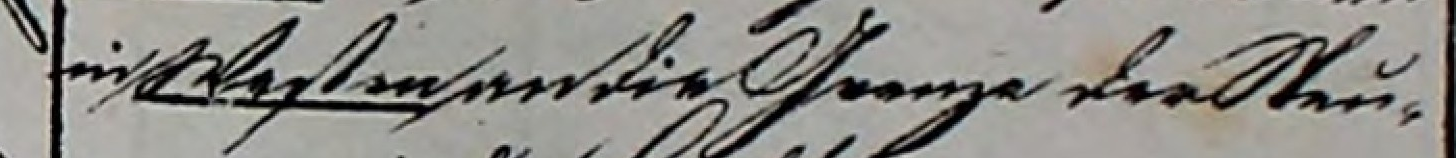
in Westen an die Grenze der Steu„
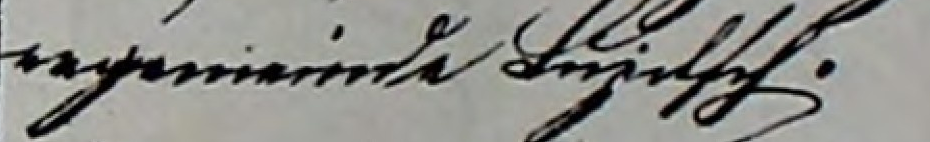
ergemeinde Lupitsch.
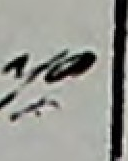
72
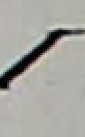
I
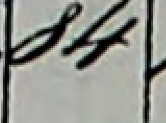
84
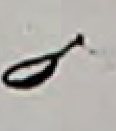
8
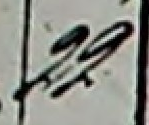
22
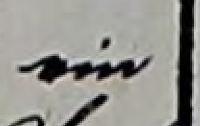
ein
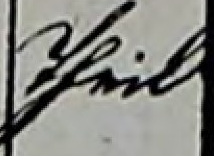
Theil
